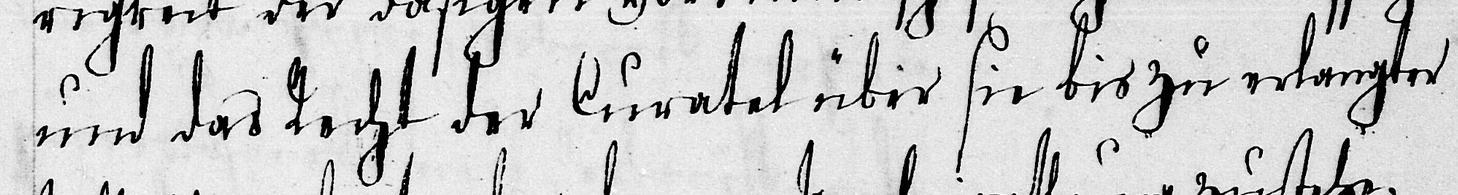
und das Recht der Curatel über sie bis zu erlangter
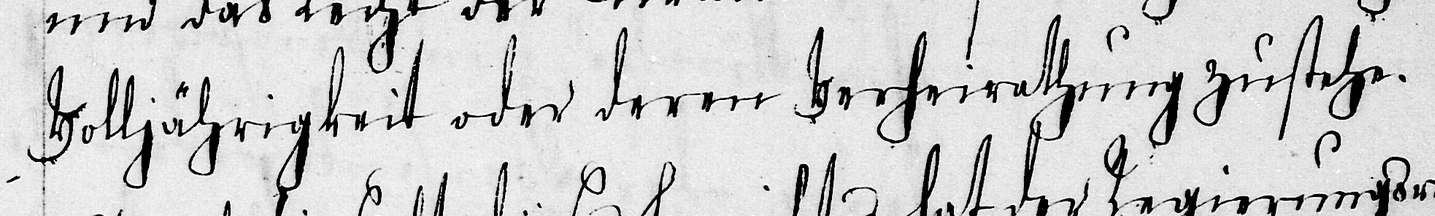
Volljährigkeit oder deren Verheirathung zustehe.
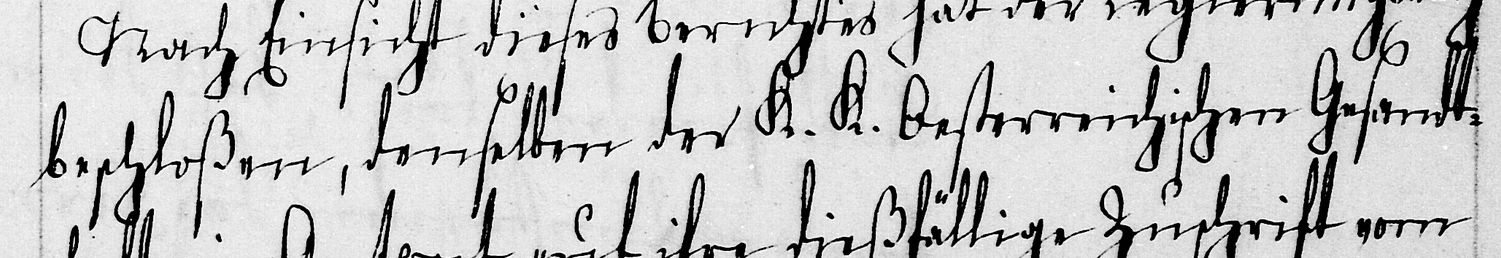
beschloßen, denselben der K. K. Oesterreichischen Gesandt¬
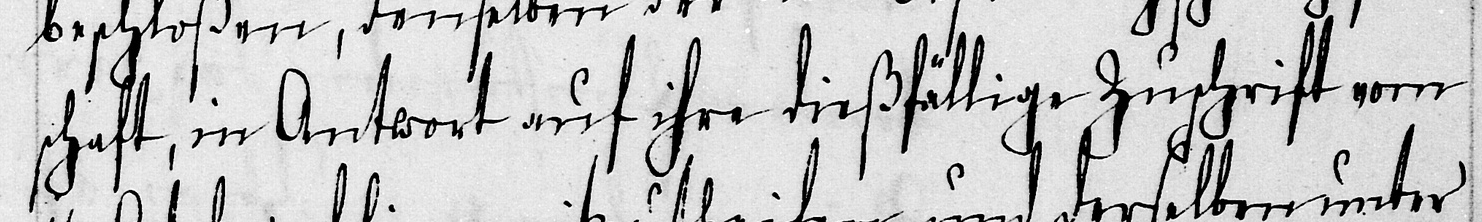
schaft, in Antwort auf ihre dießfällige Zuschrift vom
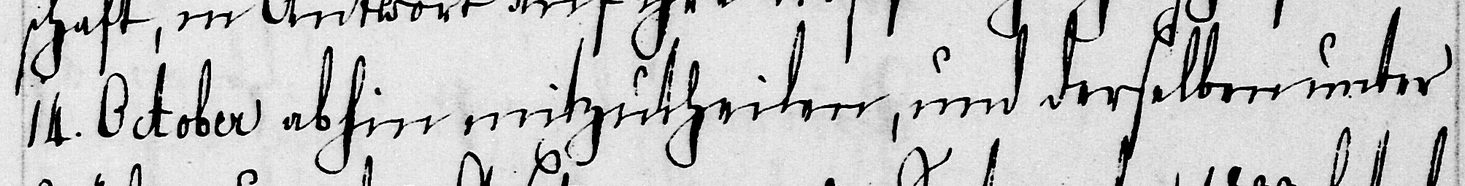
14. October abhin mitzutheilen, und derselben unter
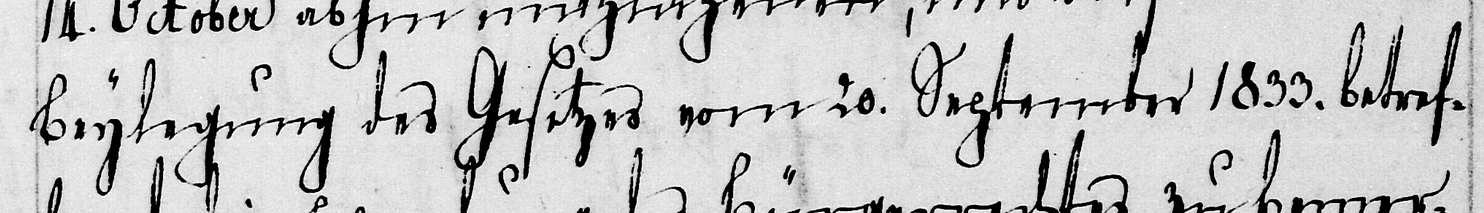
Beylegung des Gesetzes vom 20. September 1833. betref¬
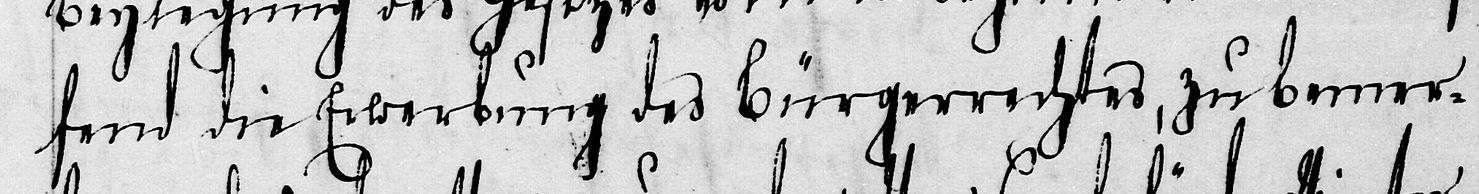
fend die Erwerbung des Bürgerrechtes, zu bemer¬
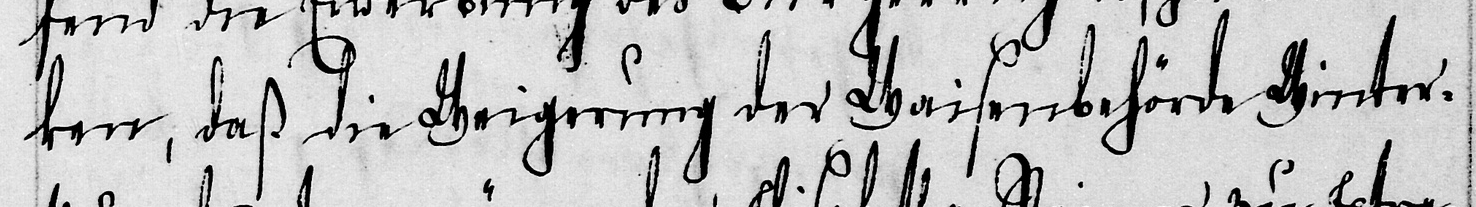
ken, daß die Weigerung der Waisenbehörde Winter¬
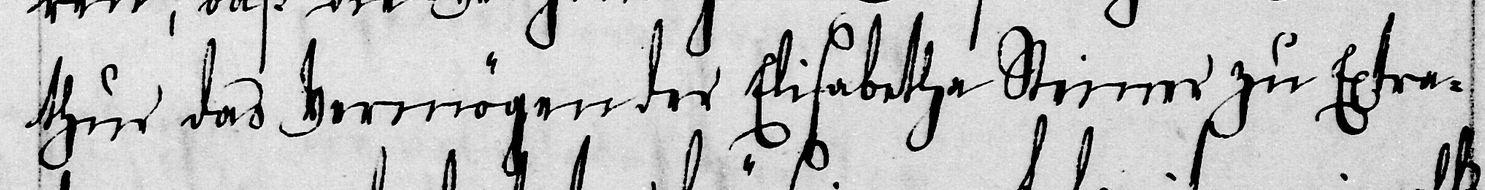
thur das Vermögen der Elisabetha Steiner zu Extra¬
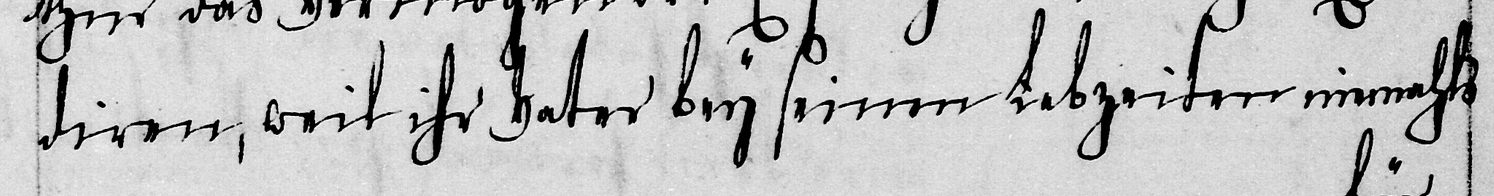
diren, weil ihr Vater bey seinen Lebzeiten niemahls
